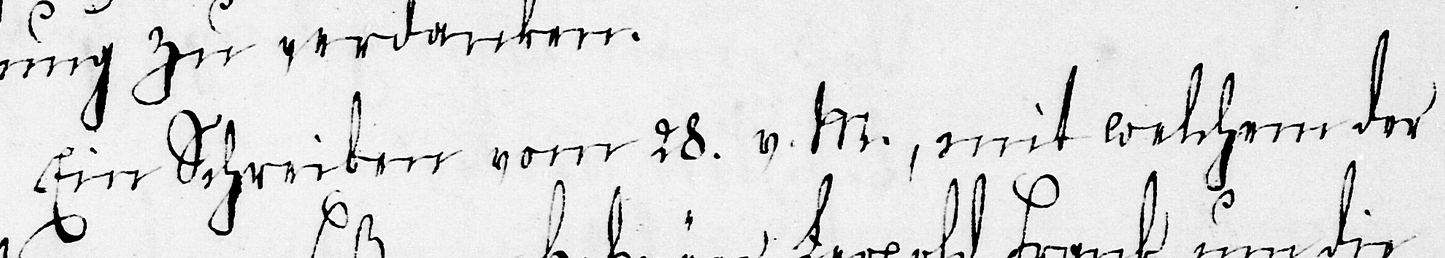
Ein Schreiben vom 28. v. M., mit welchem der
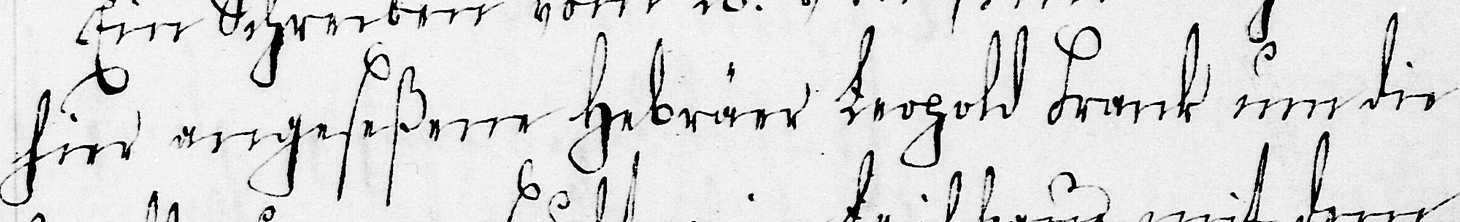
hier angeseßene Hebräer Leopold Frank um die
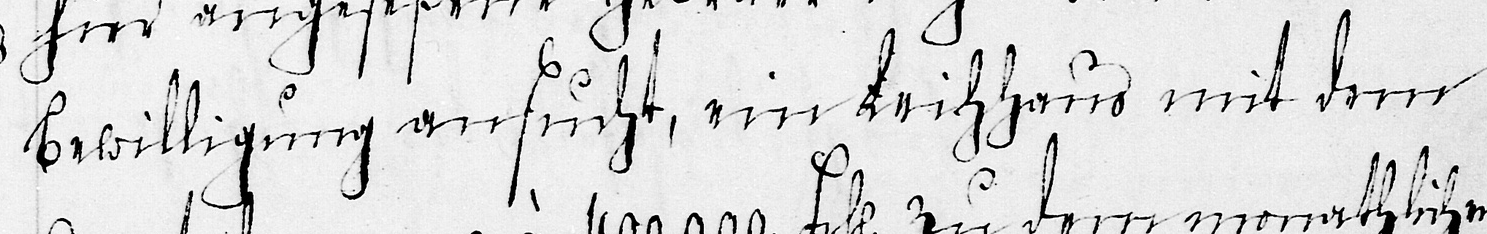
Bewilligung ansucht, ein Leihhaus mit dem
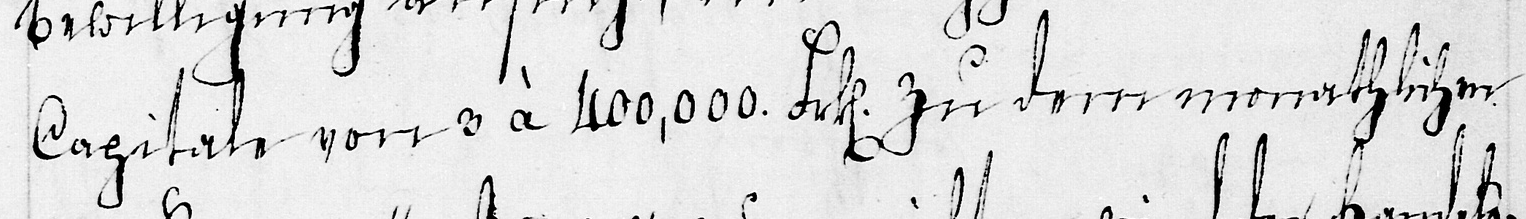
Capitale von 3 à 400,000. Frk[en]. zu dem monathlichen
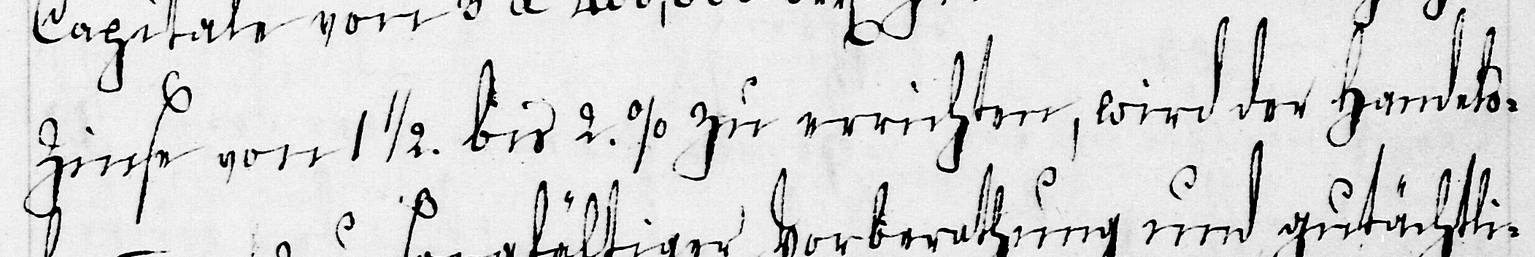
Zinse von 1 1/2. bis 2. % zu errichten, wird der Handels¬
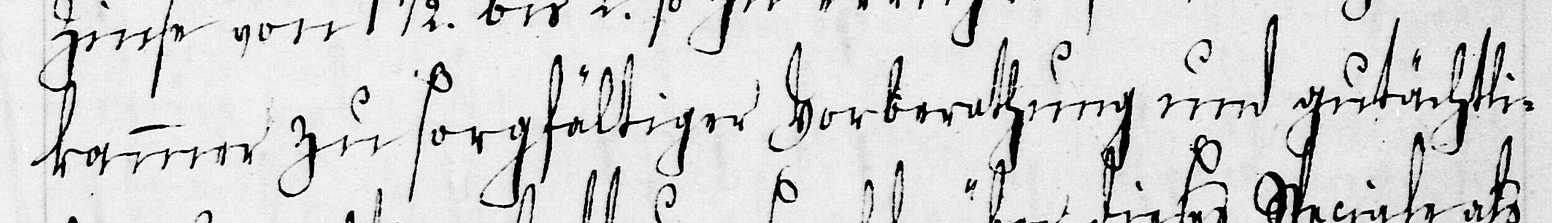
kammer zu sorgfältiger Vorberathung und gutächtli¬
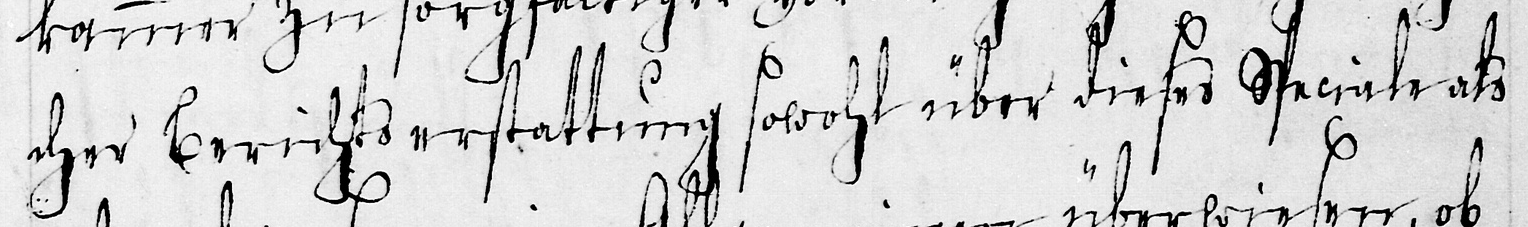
cher Berichtserstattung sowohl über dieses Speciale als
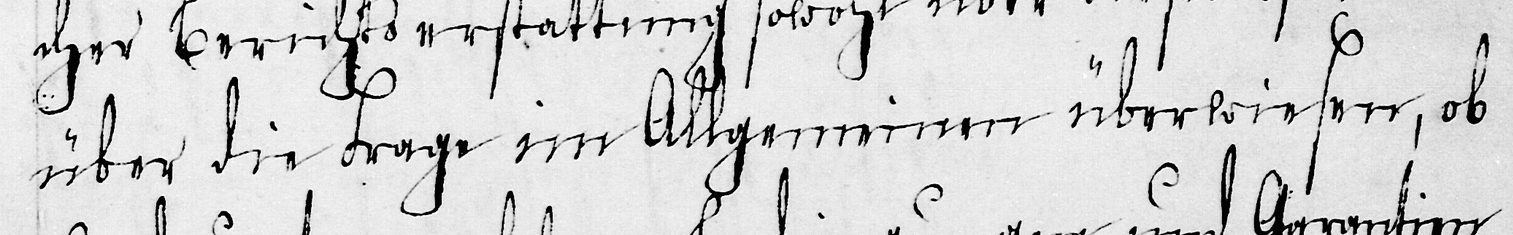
über die Frage im Allgemeinen überwiesen, ob
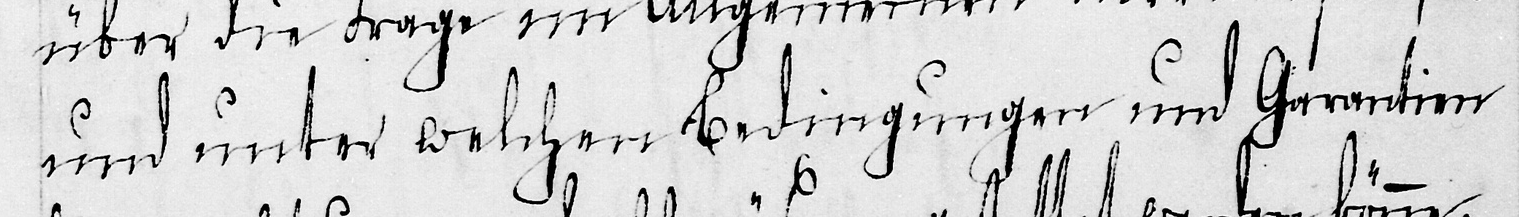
und unter welchen Bedingungen und Garantien
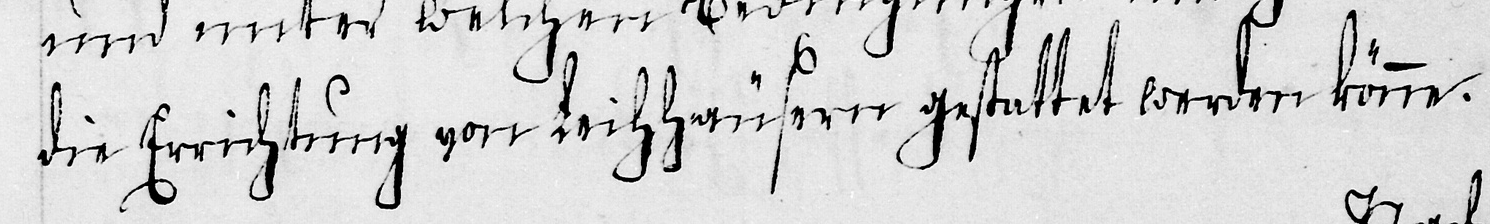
die Errichtung von Leihhäusern gestattet werden könne.
